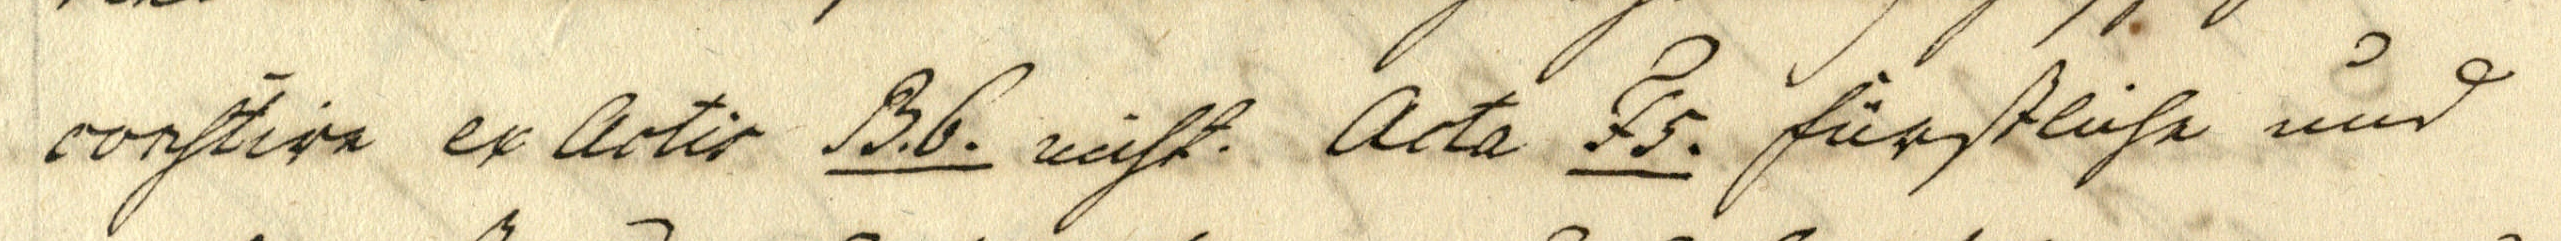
constire ex Actis B. 6. nicht. Acta F 5. fürstliche und
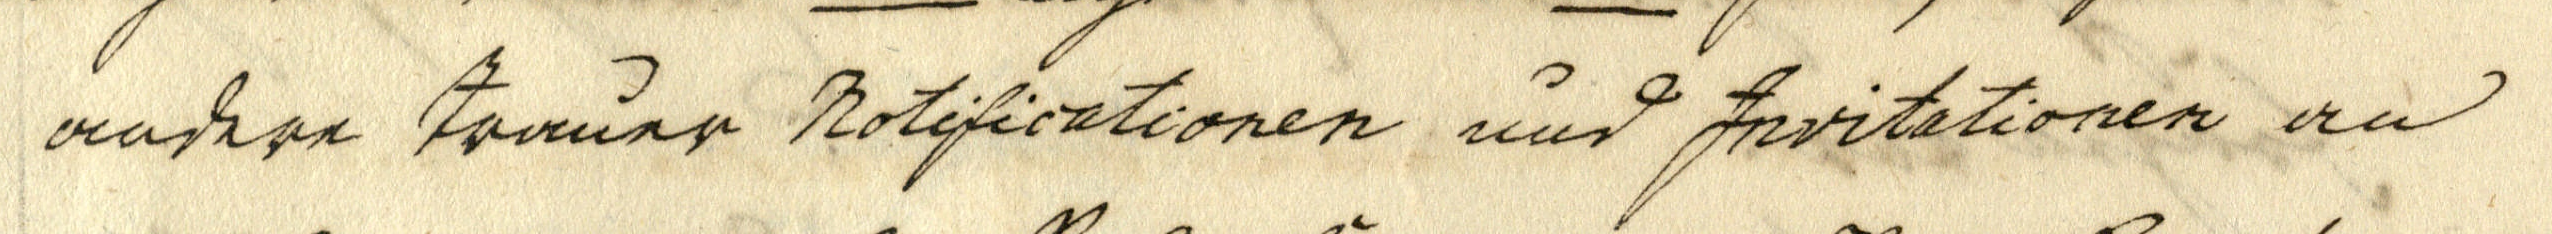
andere Trauer Notificationen und Invitationen an
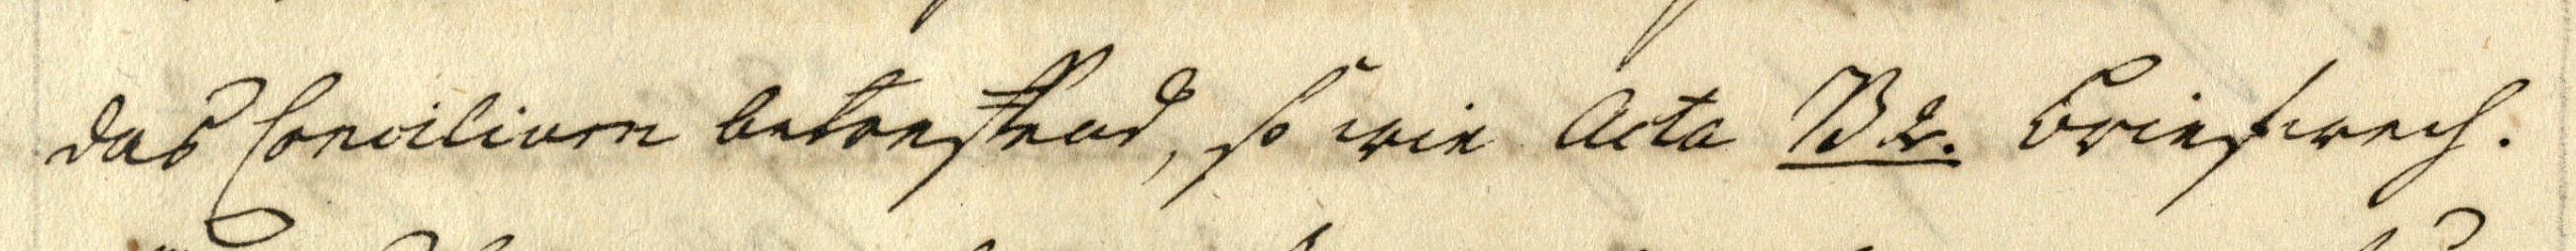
das Concilium betreffend, so wie Acta B.2. Briefwech-
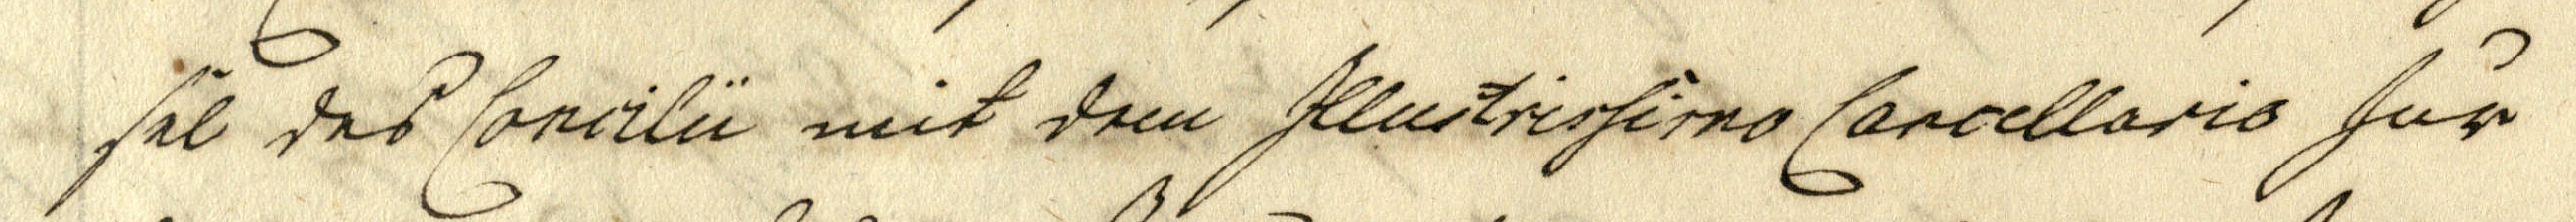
sel des Concilii mit dem Illustrissimo Cancellario zur
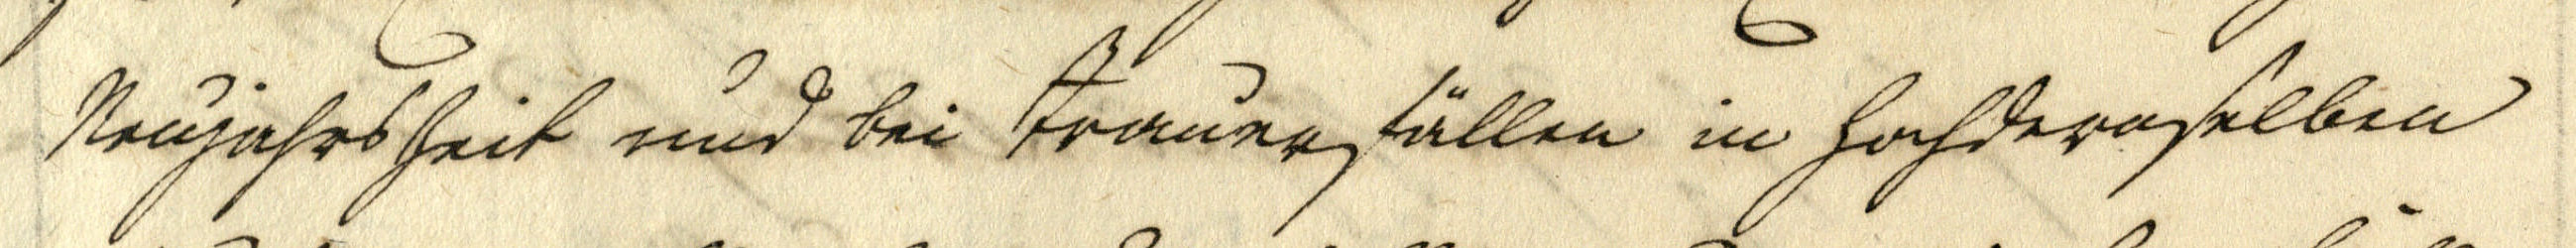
Neujahrszeit und bei Trauerfällen in hochderoselben
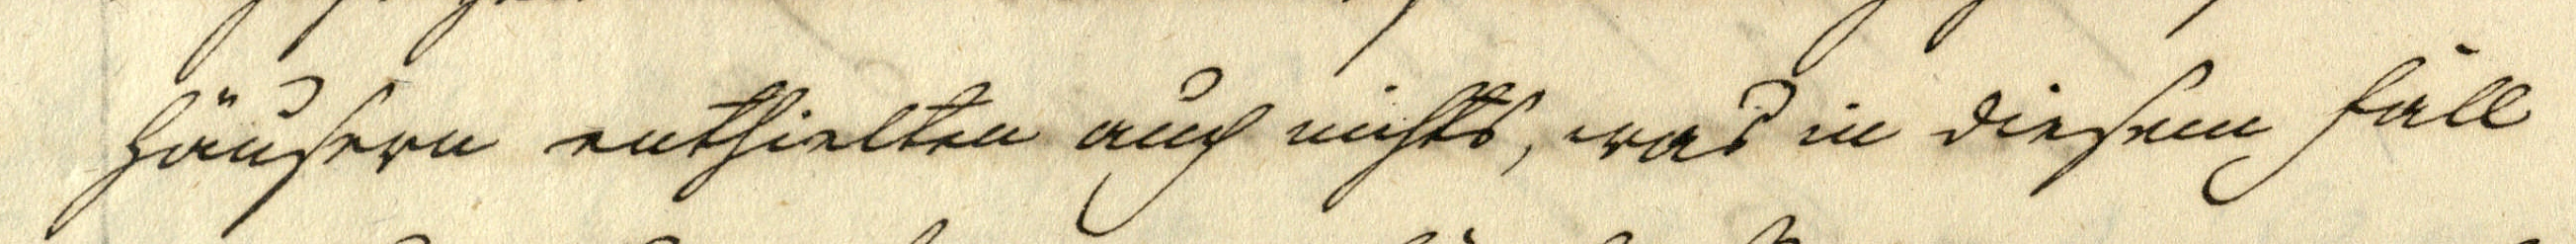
Häusern enthielten auch nichts, was in diesem Fall
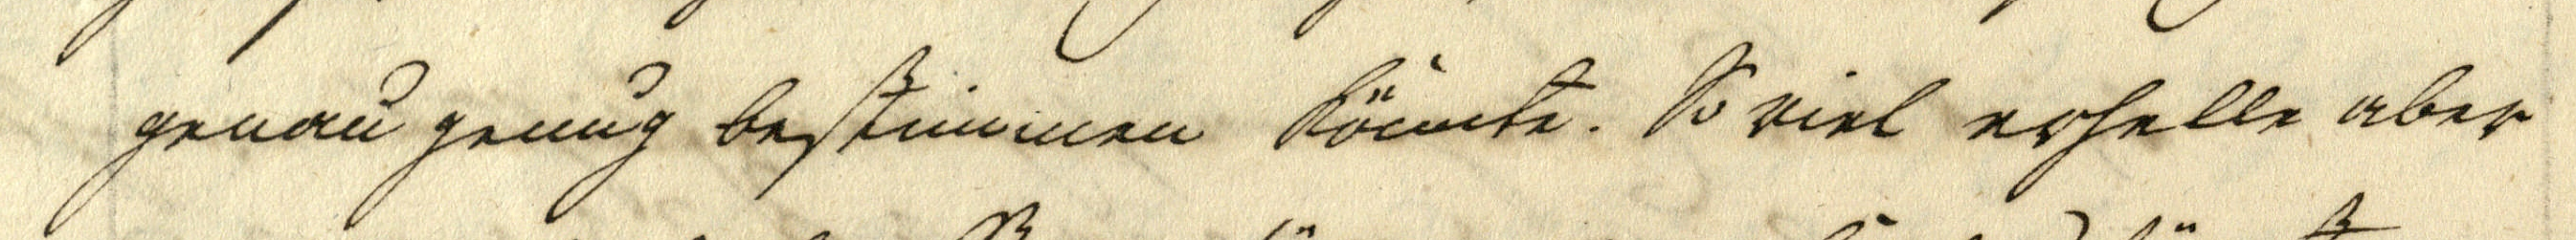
genau genug bestimmen könnte. So viel erhelle aber
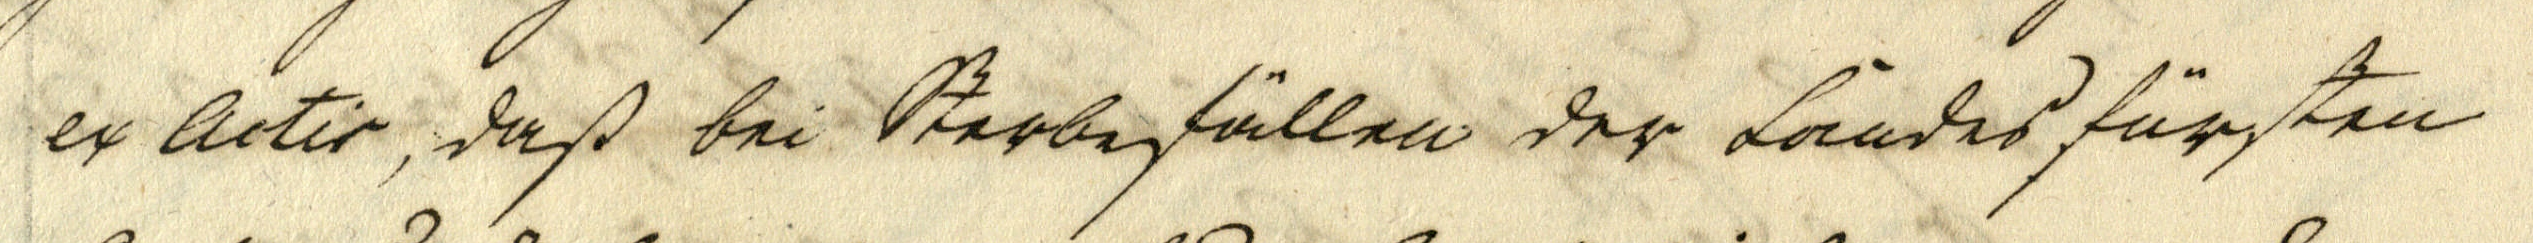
ex Actis, daß bei Sterbefällen der Landesfürsten
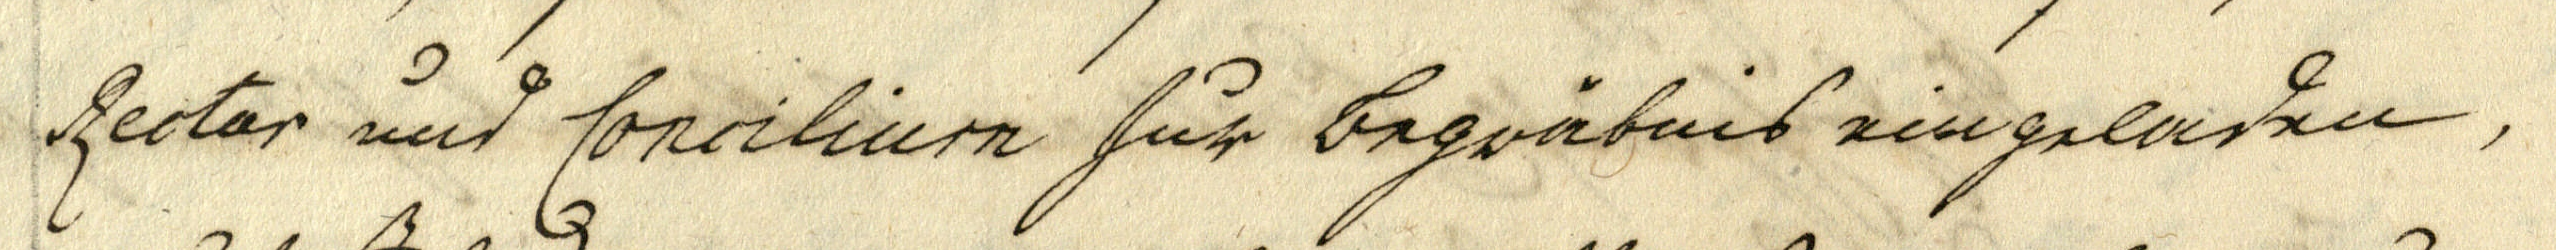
Rector und Concilium zur Begräbnis eingeladen,
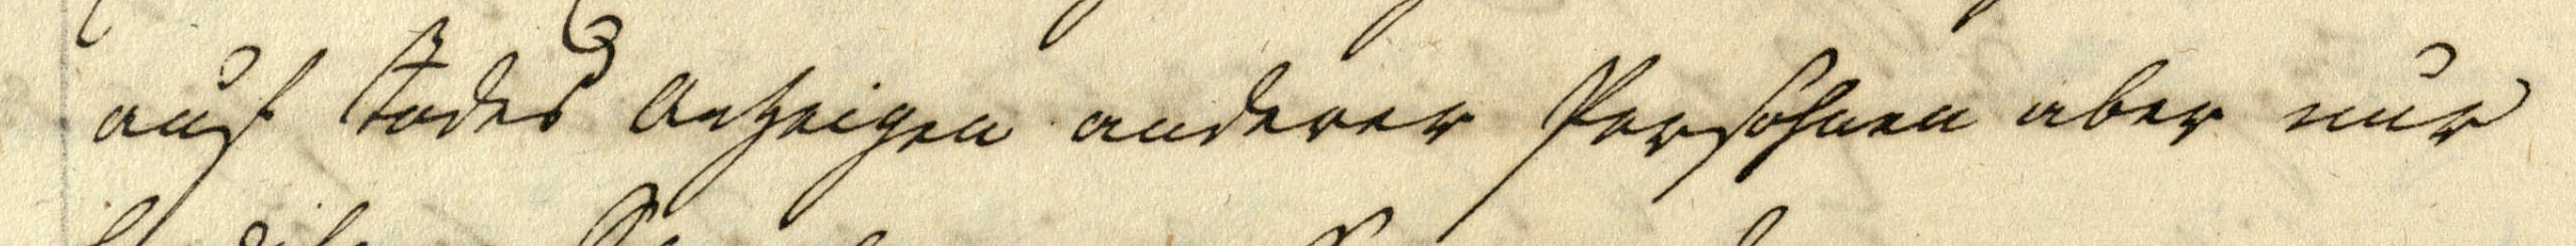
auf Todes Anzeigen anderer Persohnen aber nur
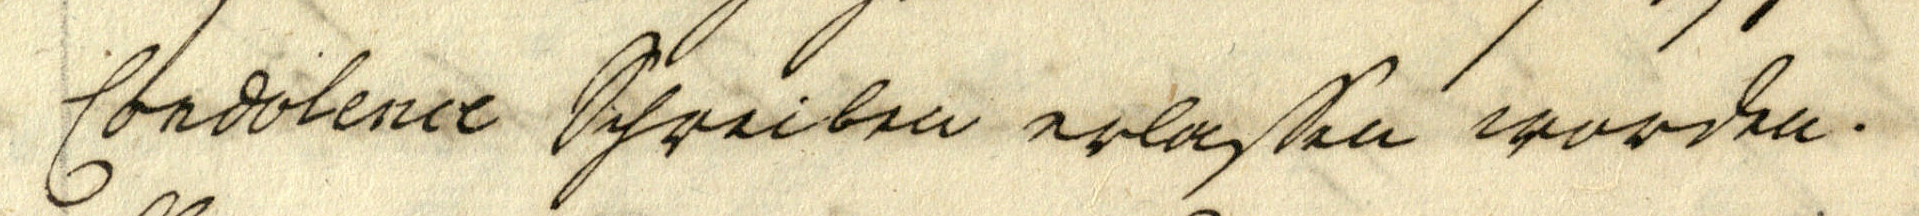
Condolence Schreiben erlassen worden.
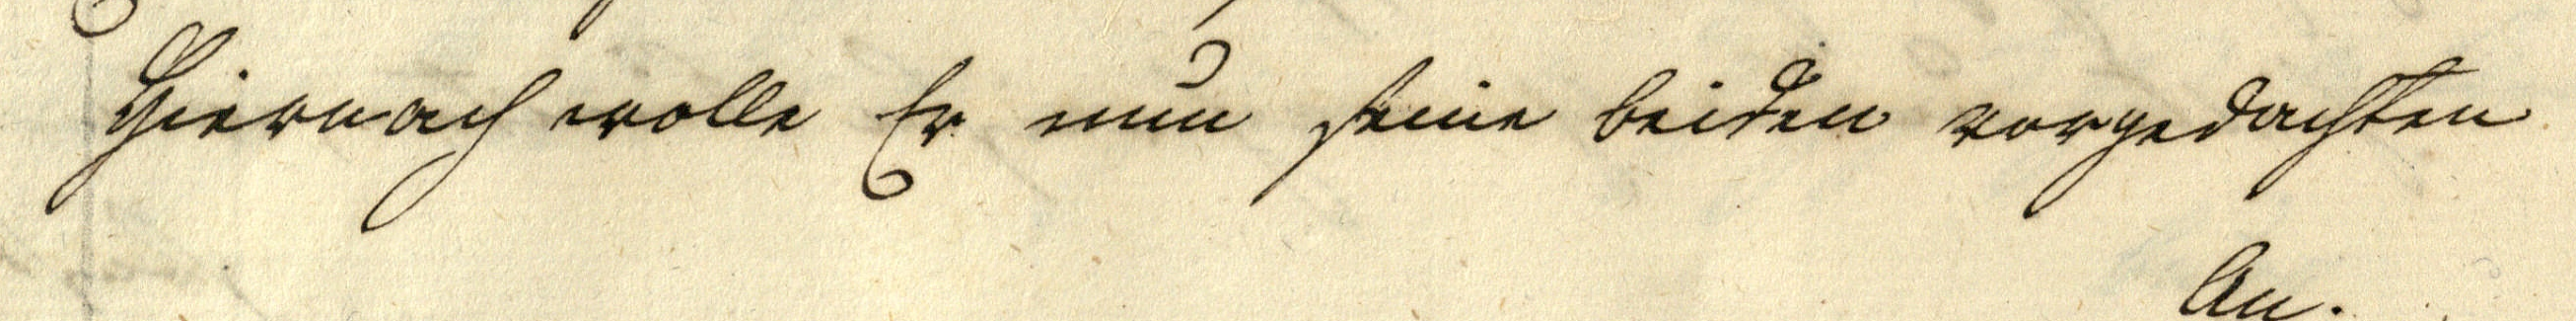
Hiernach wolle Er nun seine beiden vorgedachten
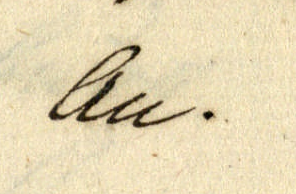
An-
